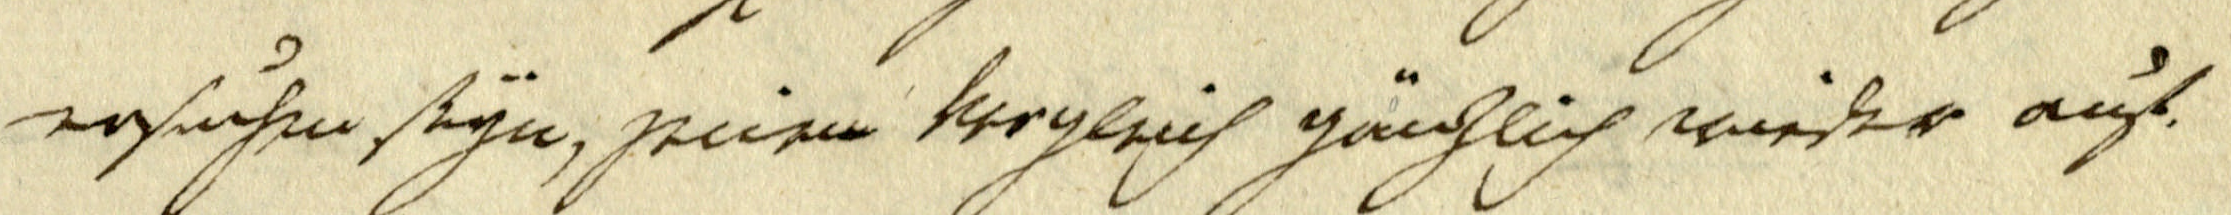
ersuchen seÿn, jenen Vergleich gänzlich wieder auf¬
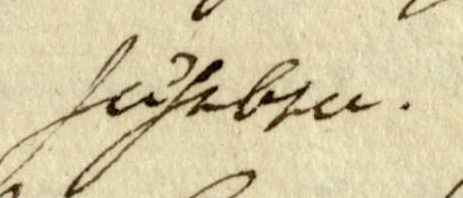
zuheben.
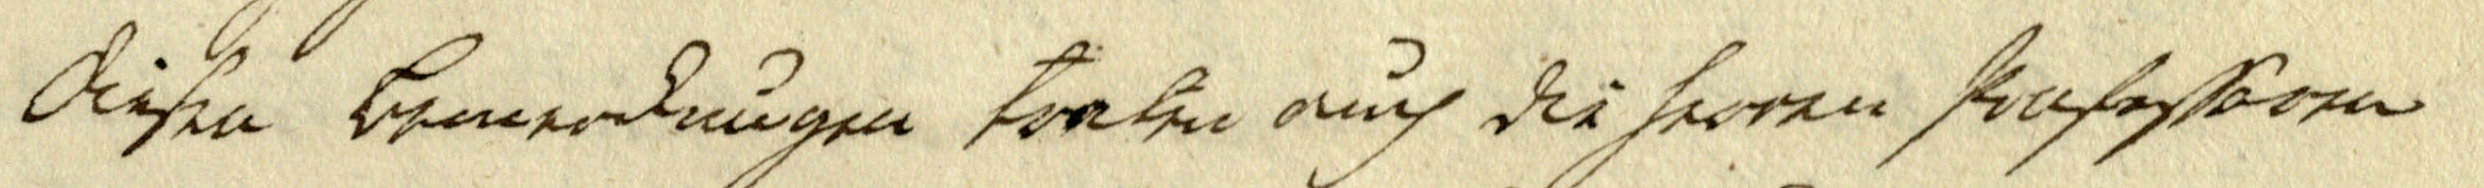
Diesen Bemerckungen traten die herren Professoren
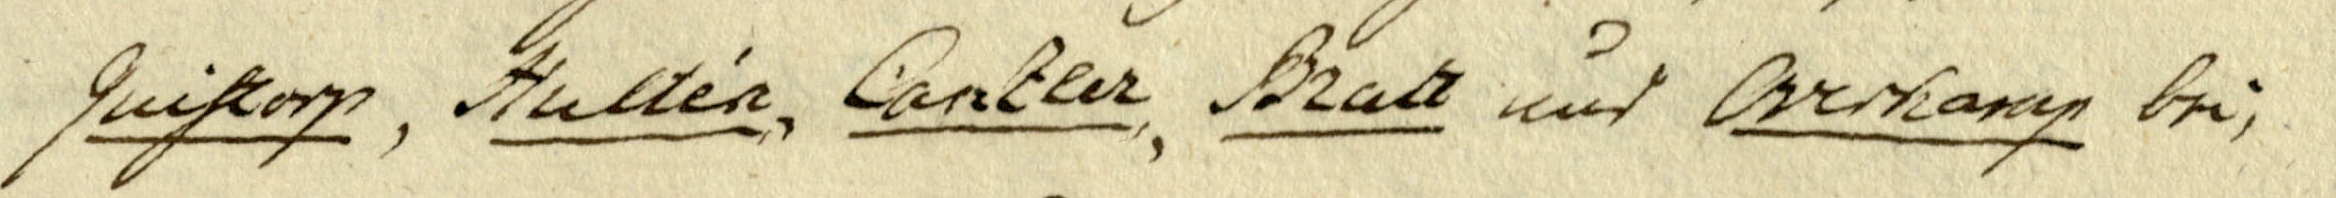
Quistorp, Hultén, Canzler, Bratt und Overkamp bei,
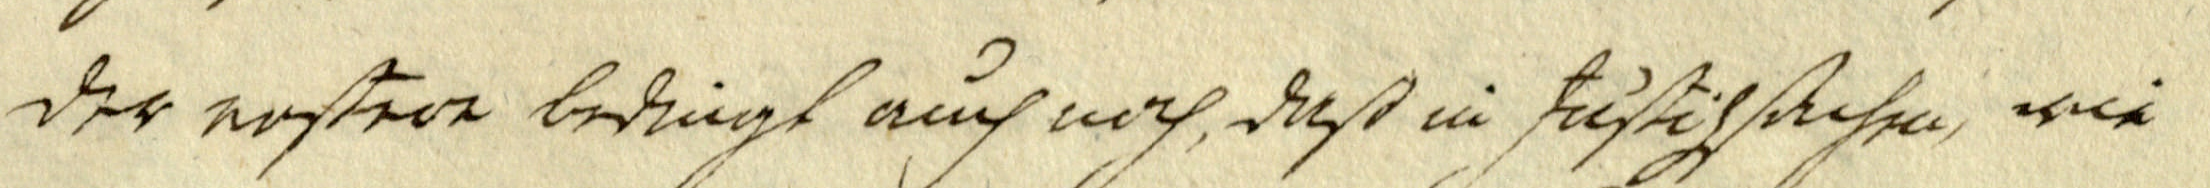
der erstere bedingt auch noch, daß in Justizsachen, wie
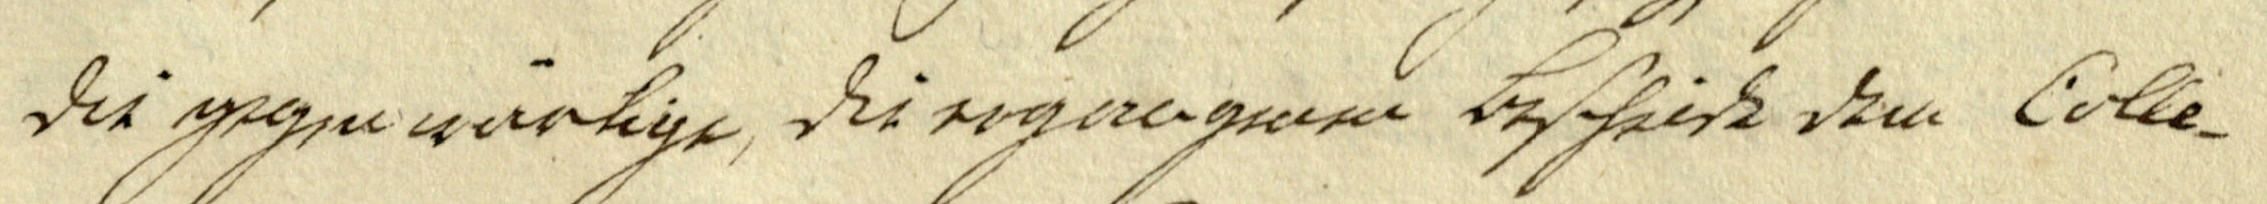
die gegenwärtige, die ergangenen Bescheide dem Colle¬
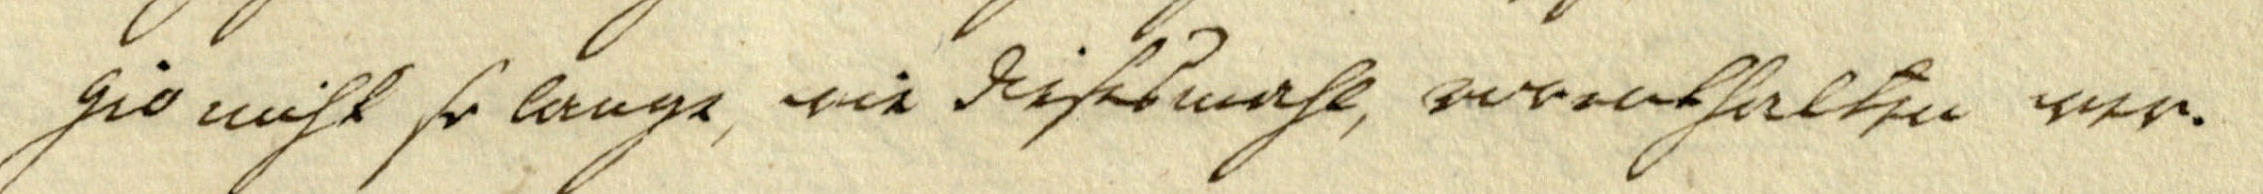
gio nicht so lange, wie diesesmahl, vorenthalten wer¬
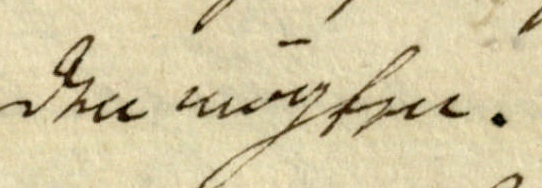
den mögten.
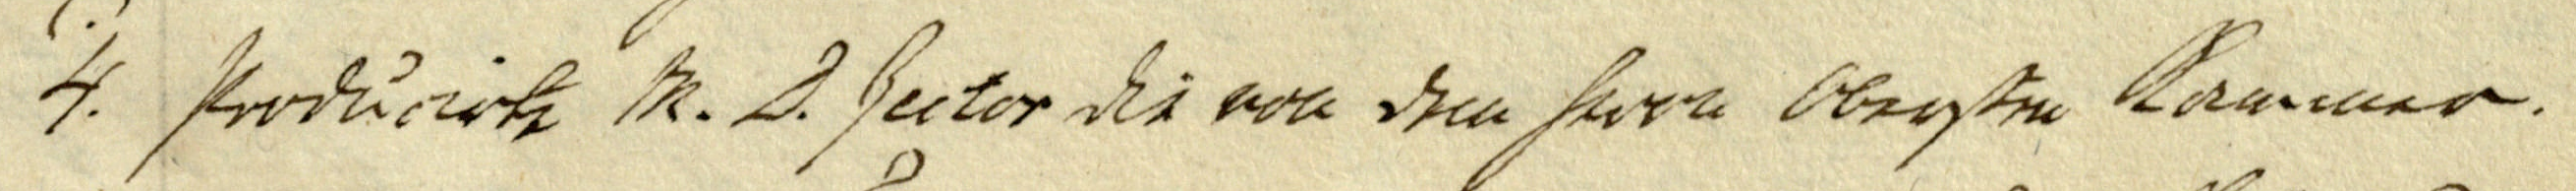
4. Producirte M. D. Rector die von dem herrn obersten Kammer¬
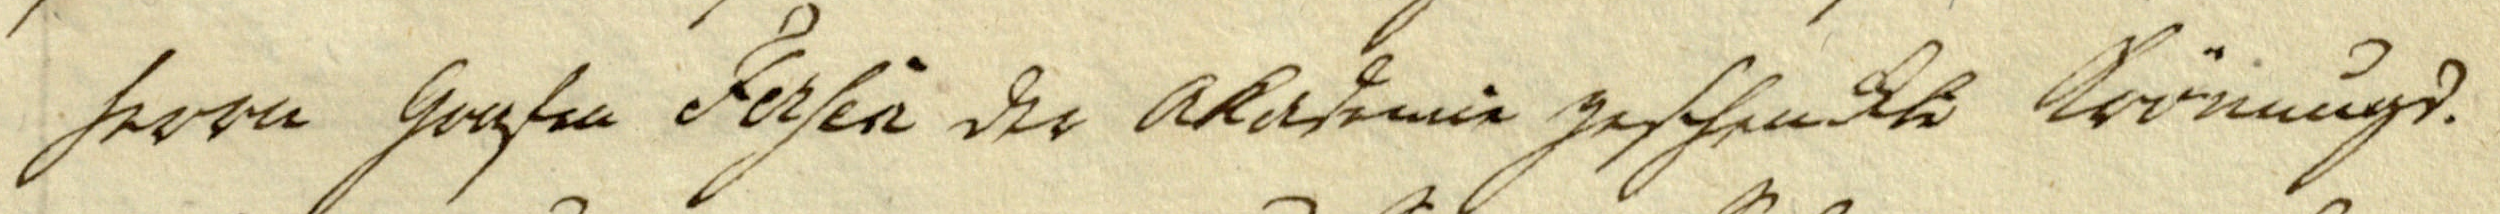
herrn Grafen Fersen der Akademie geschenckte Krönungs¬
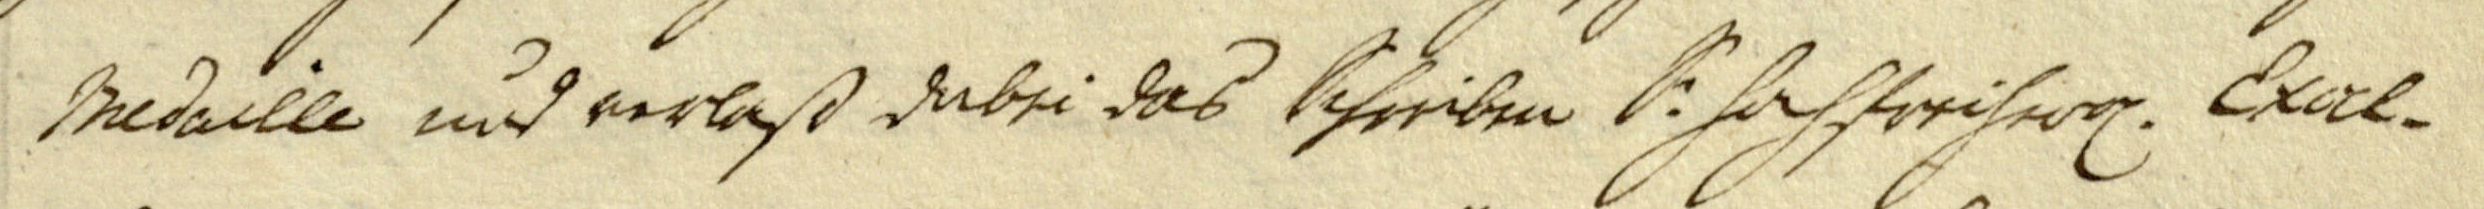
Medaille und verlas dabei das Schreiben Sr. hochfreiherrl. Excel¬
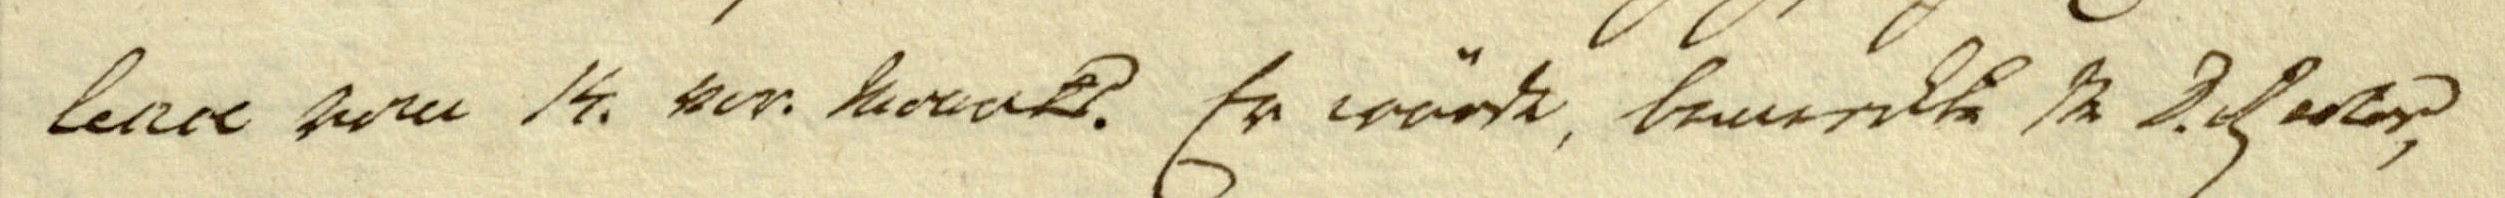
lence vom 14. vor. Monats. Er würde, bemerckte M. D. Rector,
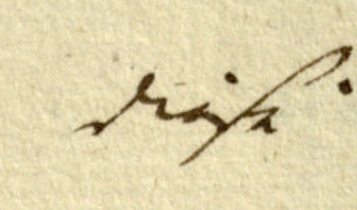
diese
